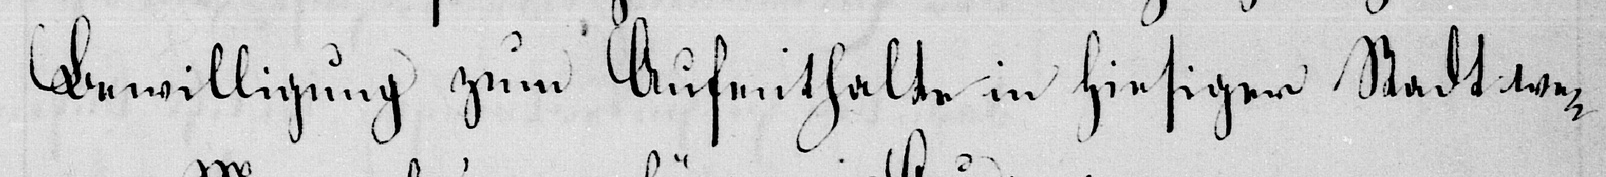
Bewilligung zum Aufenthalte in hiesiger Stadt we¬
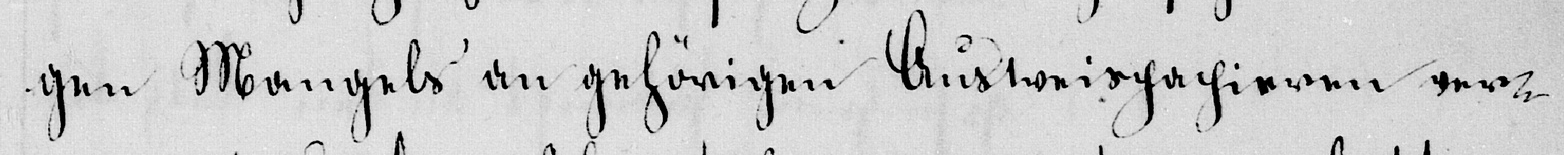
gen Mangels an gehöriger Ausweispapiere ver¬
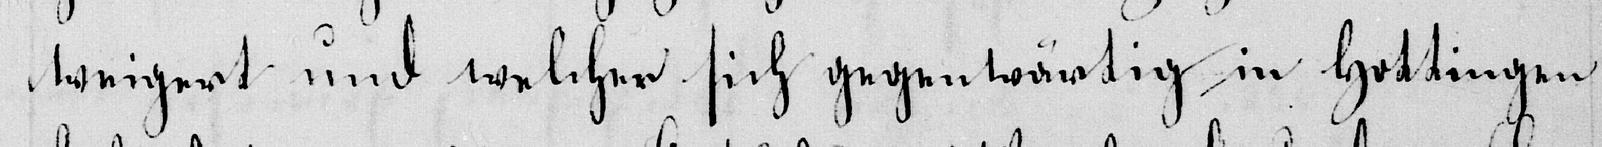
weigert und welcher sich gegenwärtig in Hottingen
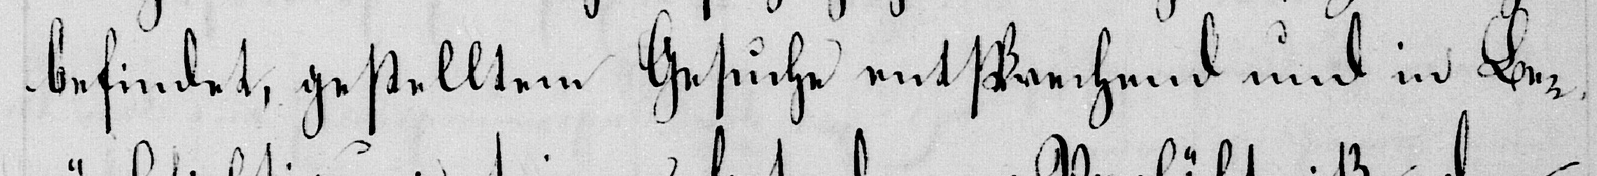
befindet, gestellten Gesuche entsprechend und in Be¬
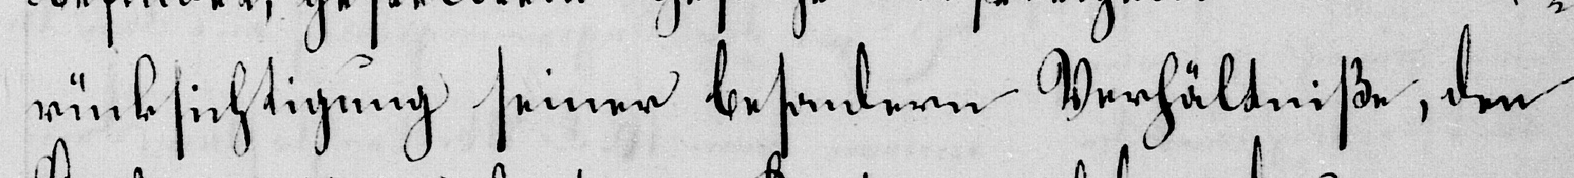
rücksichtigung seiner besondern Verhältniße, den
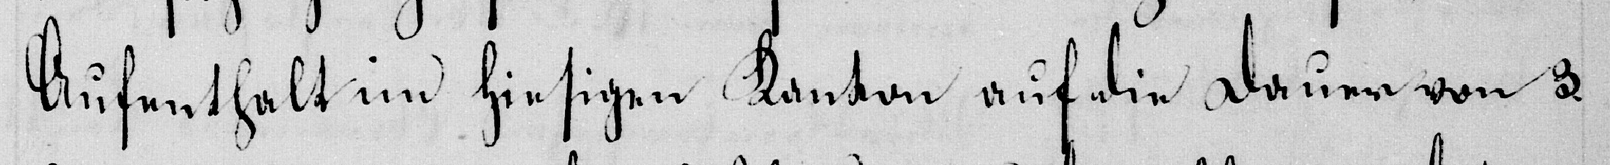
Aufenthalt im hiesigen Kanton auf die Dauer von 3.
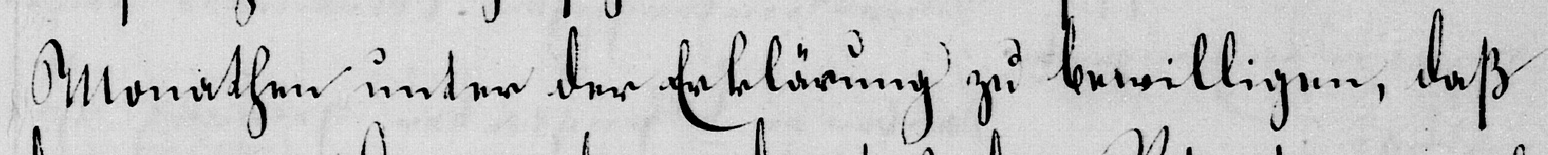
Monathen unter der Erklärung zu bewilligen, daß
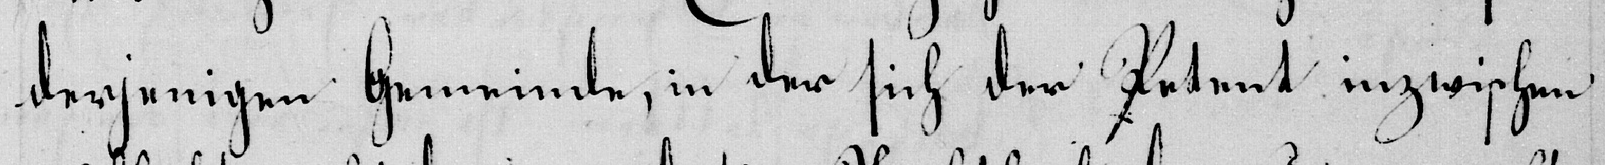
derjenigen Gemeinde, in der sich der Petent inzwischen
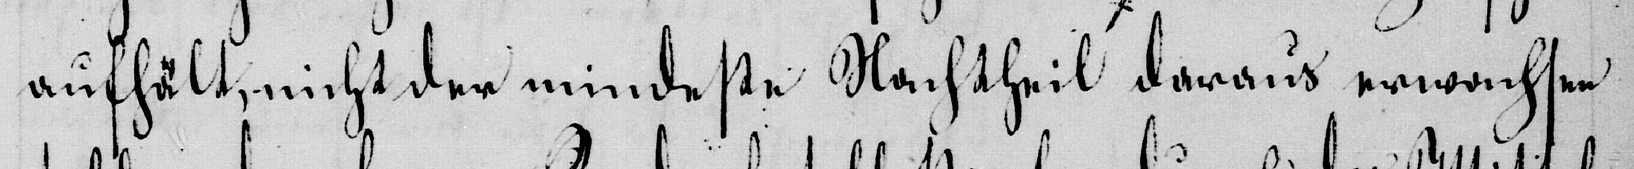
aufhält, nicht der mindeste Nachtheil daraus erwachsen
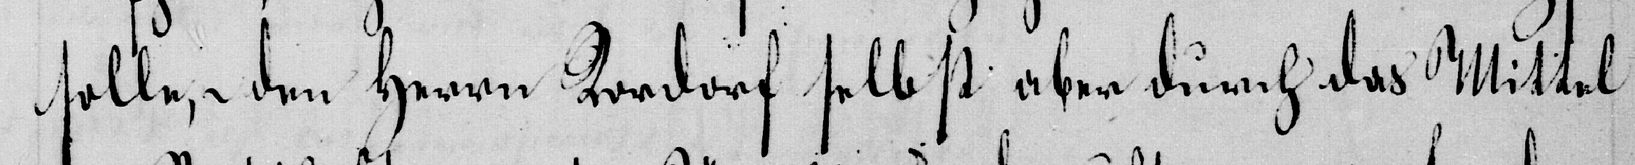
solle, – den Herrn Rordorf selbst aber durch das Mittel
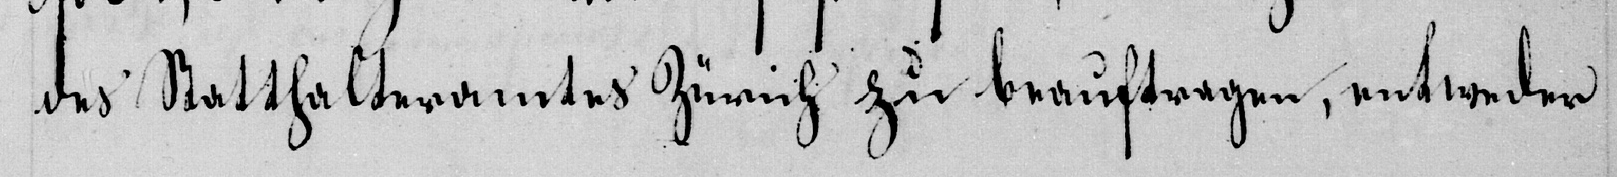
des Statthalteramtes Zürich zu beauftragen, entweder
